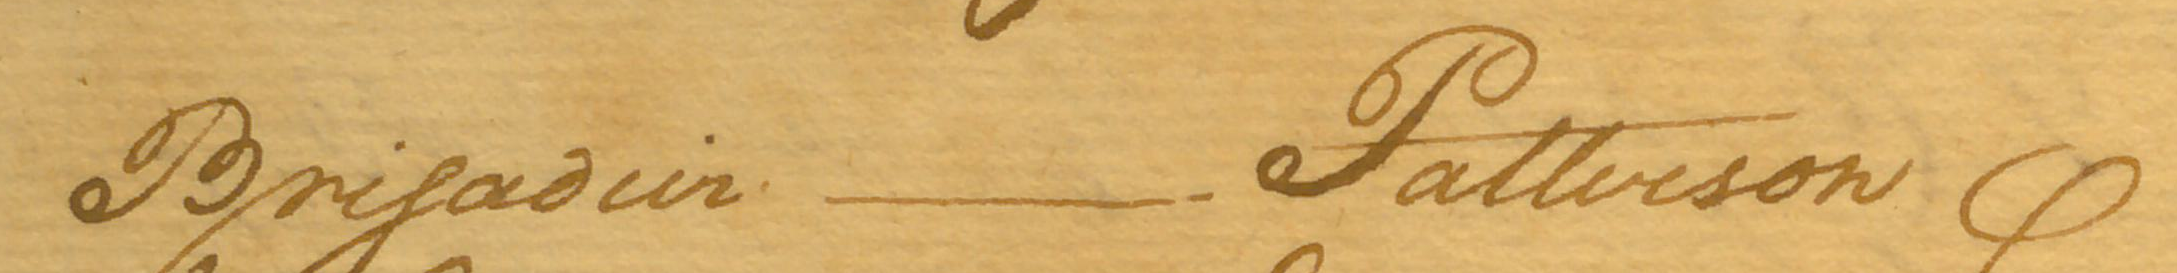Brigadier- Patterson
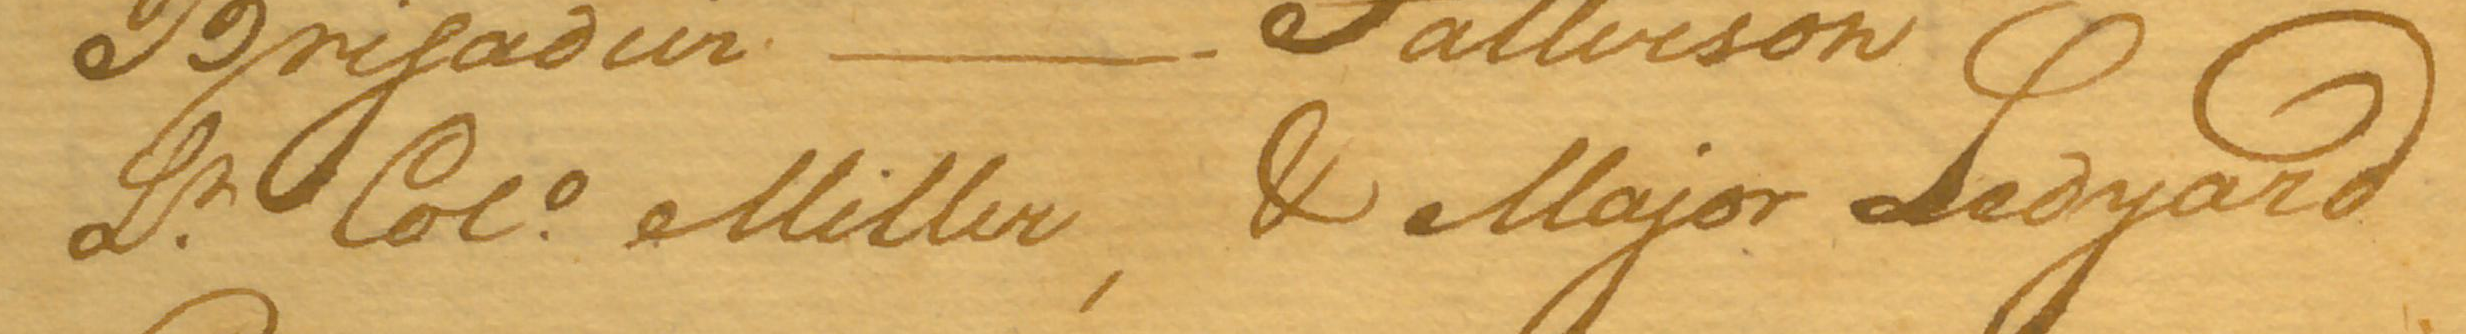L^t. Col^o. Miller, & Major Ledyard
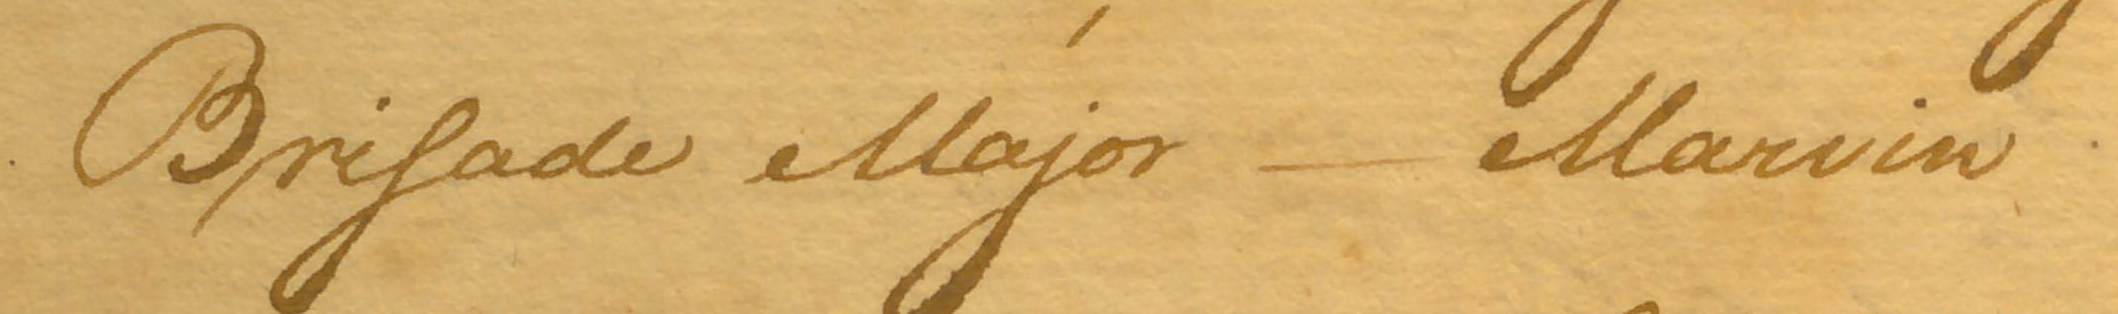Brigade Major- Marvin
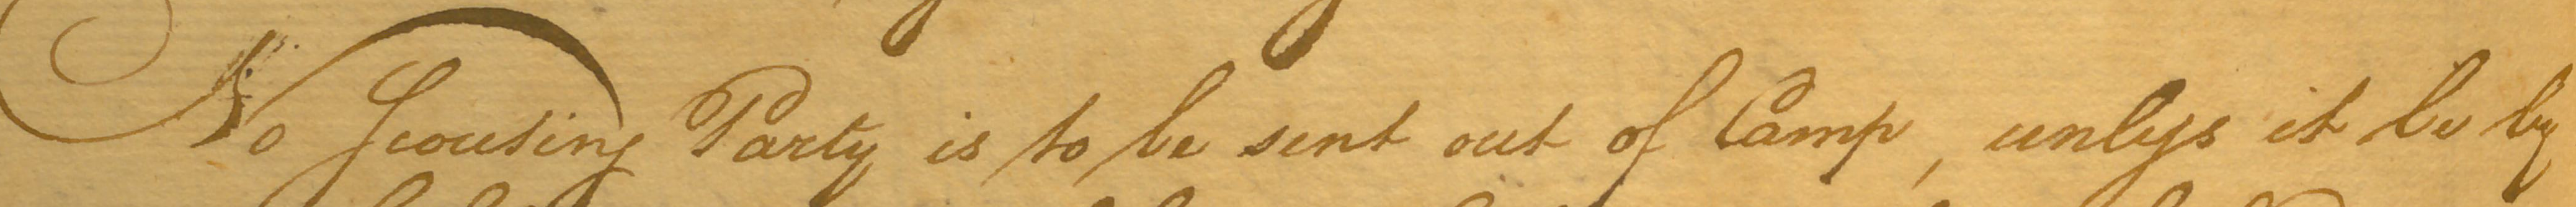No Scouting Party is to be sent out of Camp, unless it be by
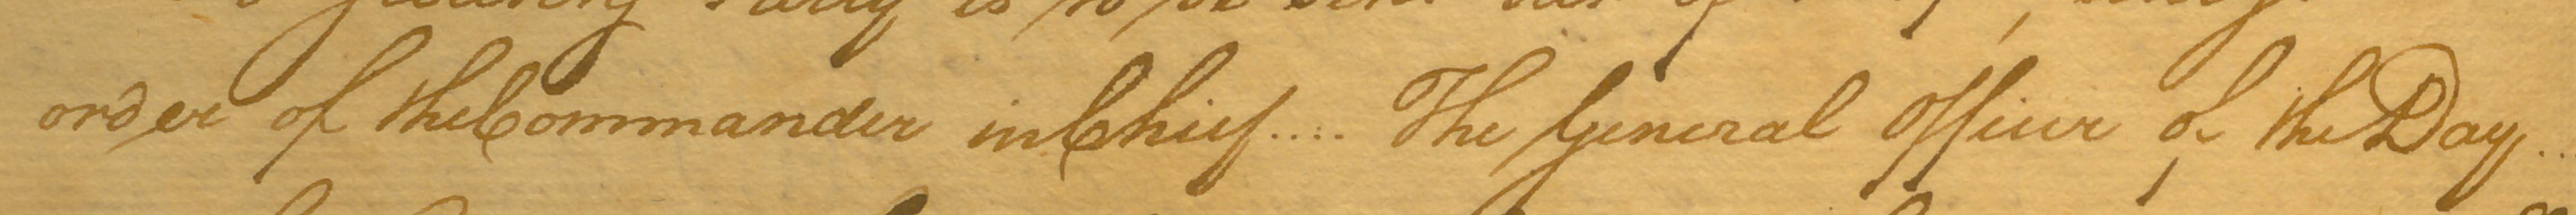order of the Commander in Chief.... The General Officer of the Day.
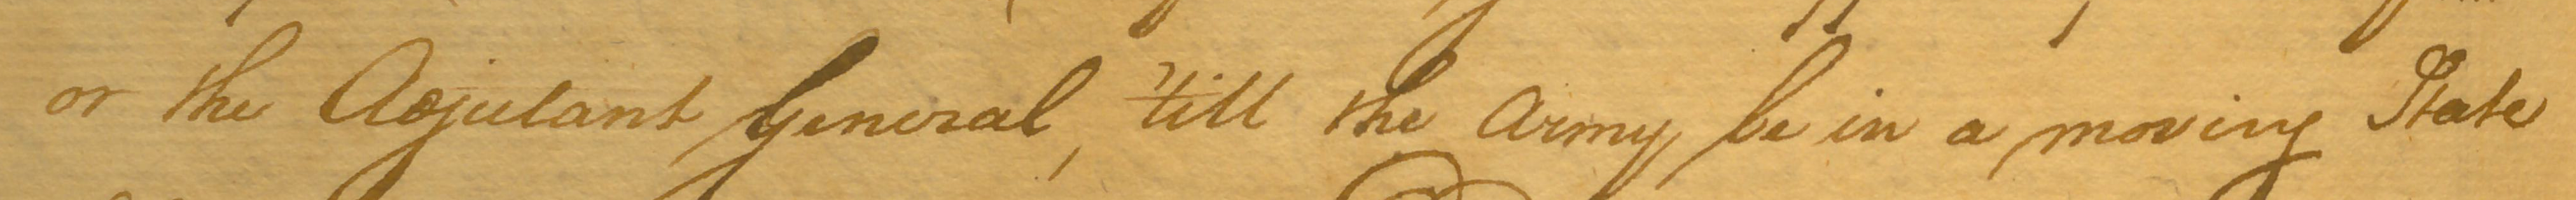or the Adjutant General, 'till the Army be in a moving State
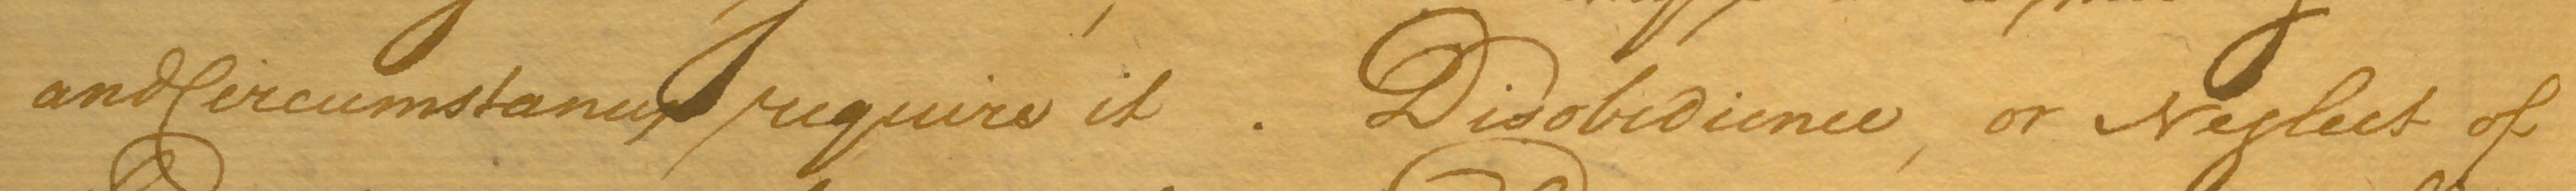and Circumstances require it. Disobedience or Neglect of
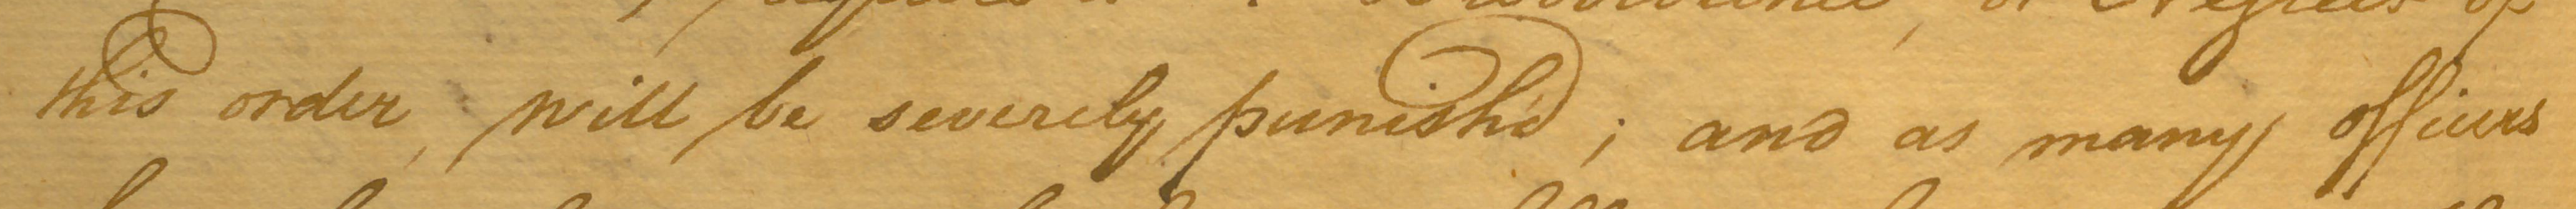this order, will be severely punish'd; and as many officers
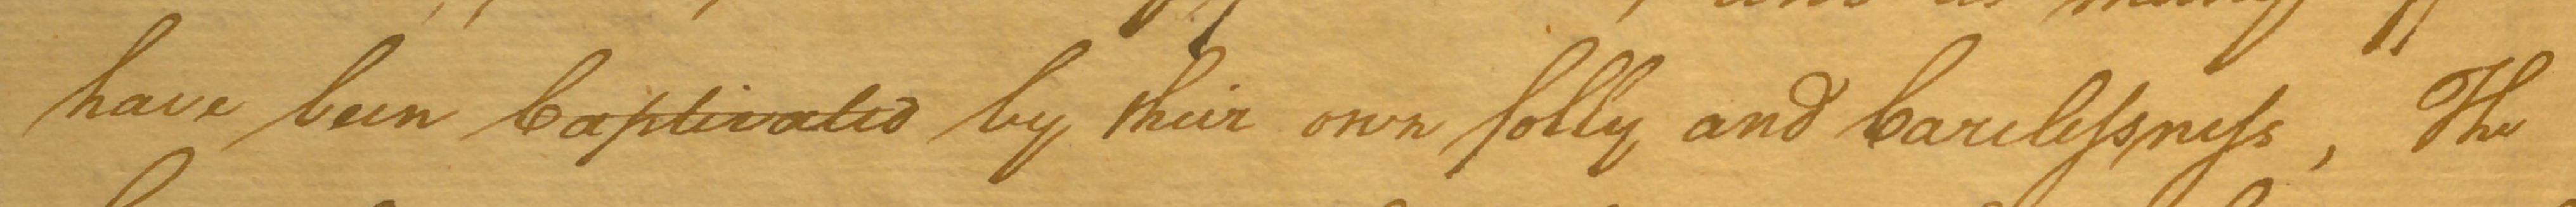have been Captivated by their own folly and Carelessness, The
